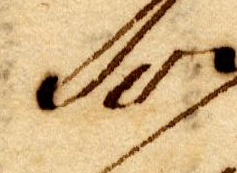Sir
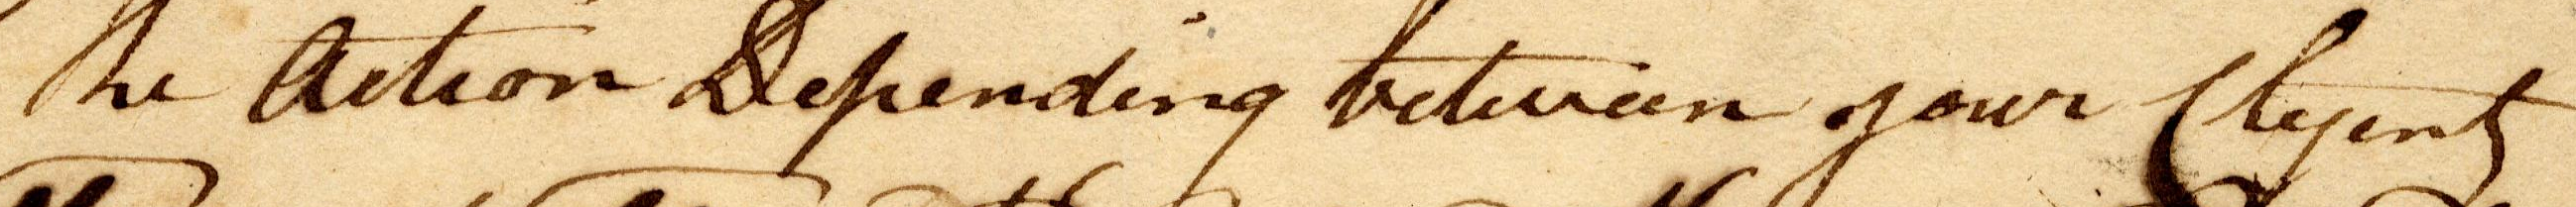The Action Depending between your Client
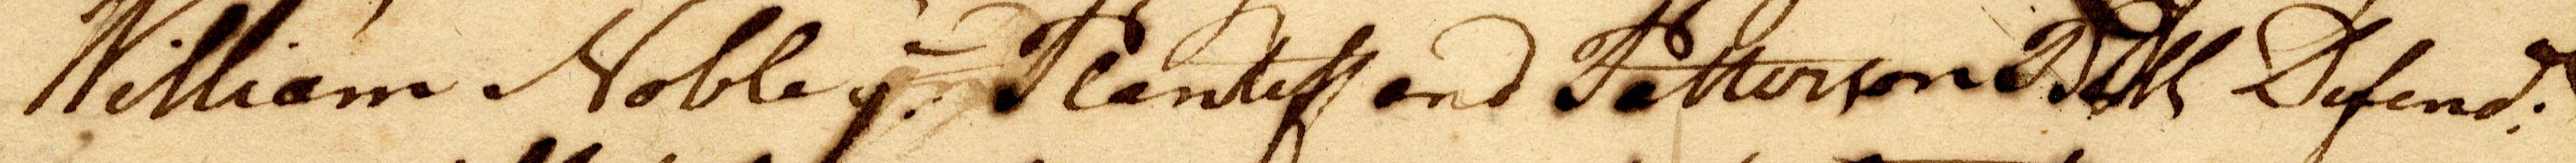William Noble y^e Plantiff and Patterson Bill Defend^t.
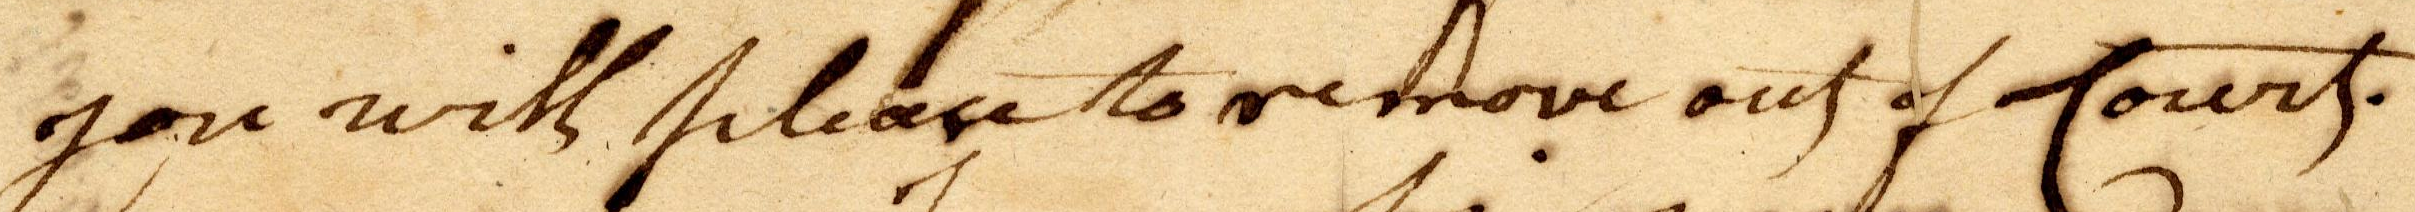you with please to remove out of Court
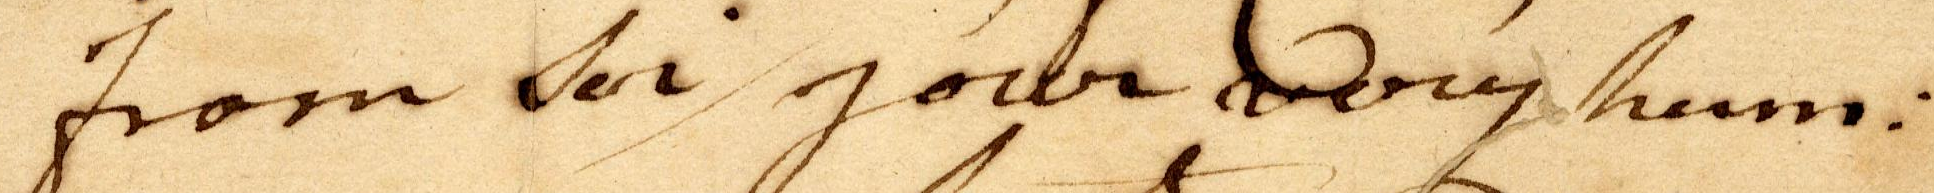from Sir your very hum.
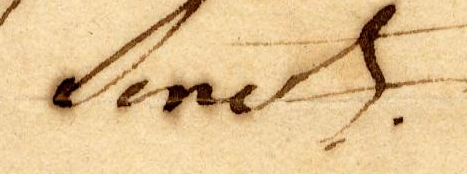Serv^t.
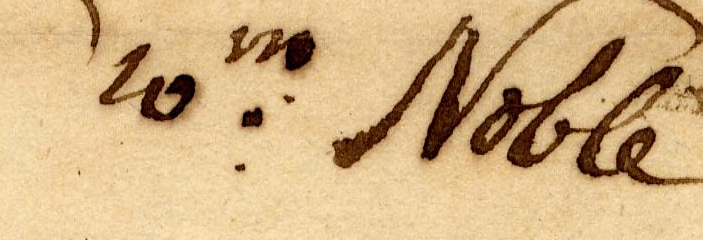W^m. Noble
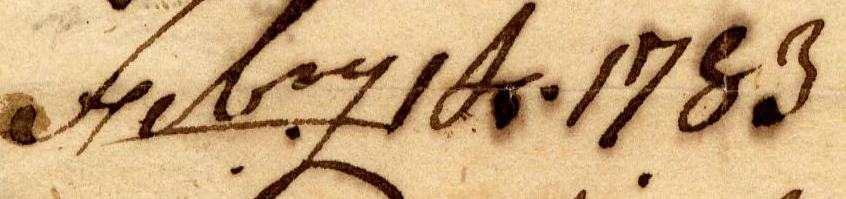Feb^ry. 12. 1783
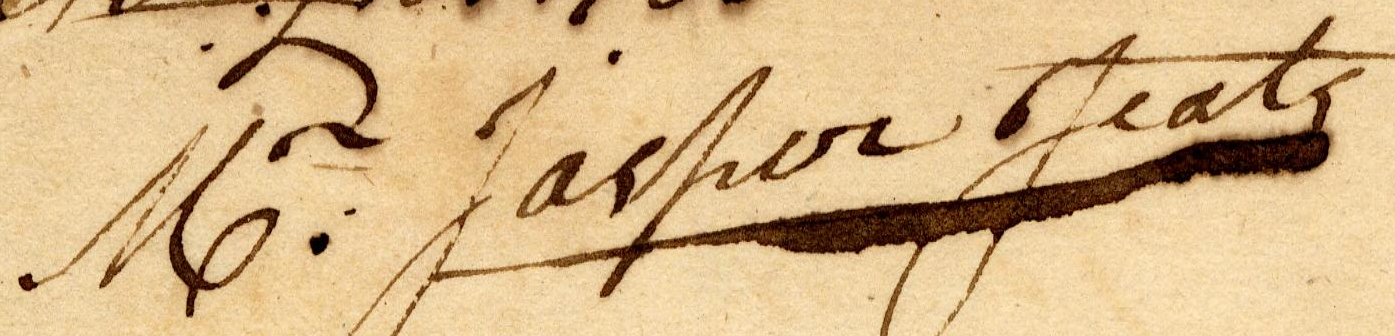M^r. Jasper Yeats
